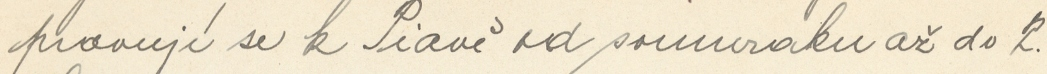pravují se k Piavě od soumraku až do 2.
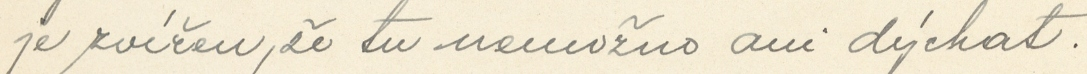je zvířen, že tu nemožno ani dýchat.
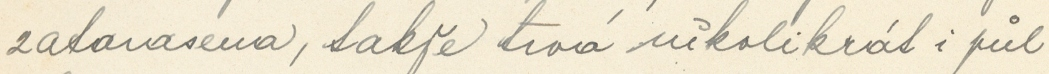zatarasena, takže trvá několikrát i půl
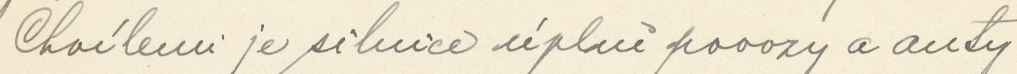Chvílemi je silnice úplně povozy a auty
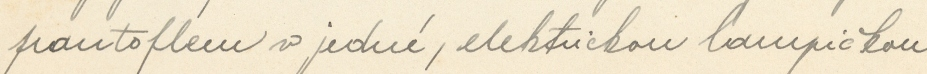pantoflem v jedné, elektrickou lampičkou
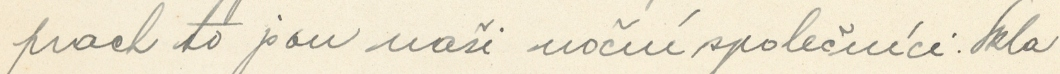prach to jsou naši noční společníci. Skla
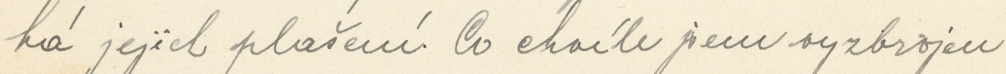há jejich plašení. Co chvíle jsem vyzbrojen
